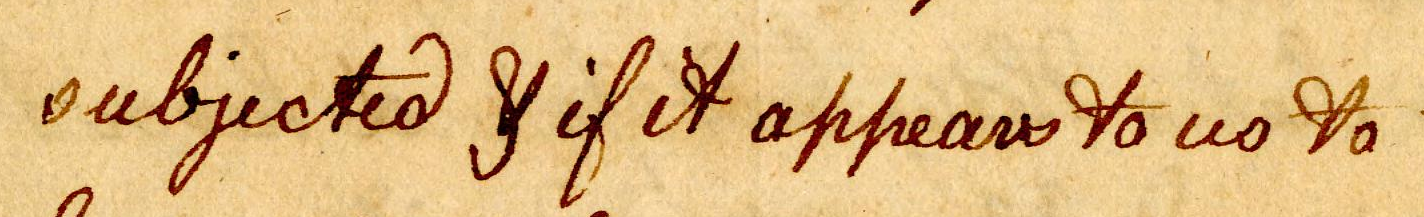subjected & if it appears to us to
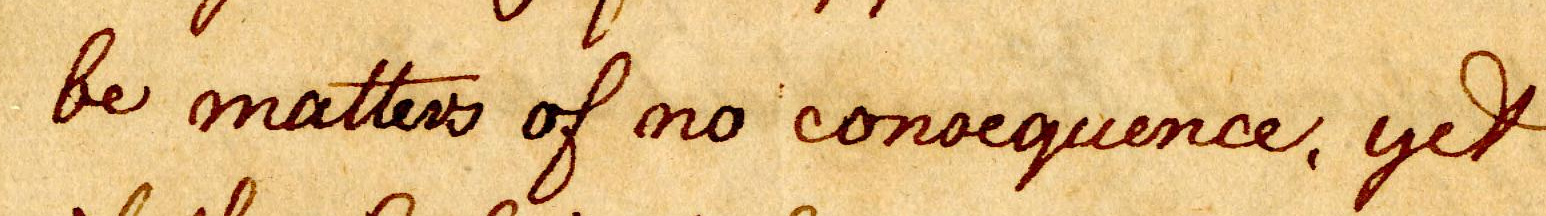be matters of no consequence, yet
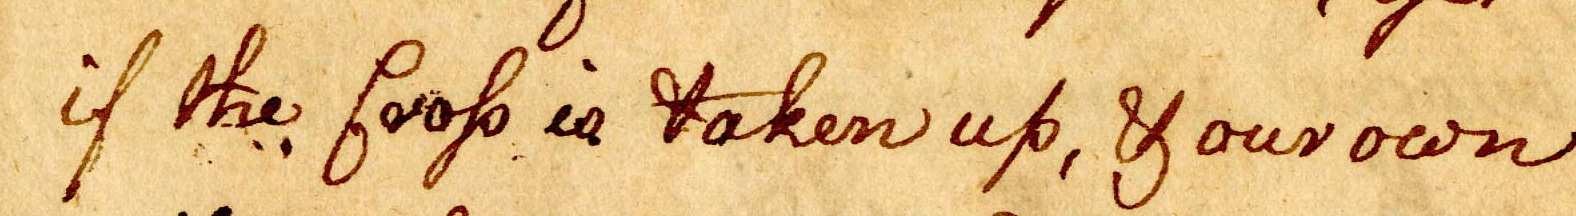if the Cross is taken up, & our own
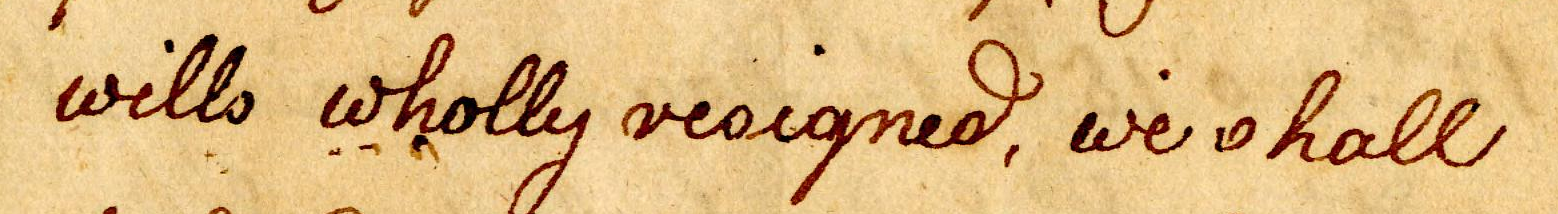wills wholly resigned, we shall
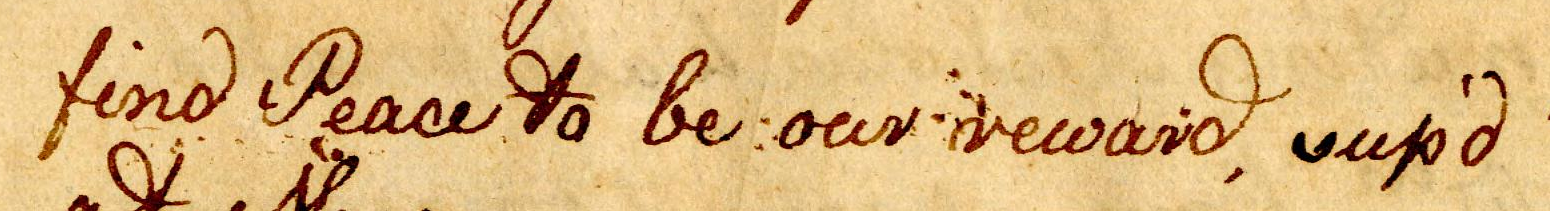find Peace to be our reward, sup'd
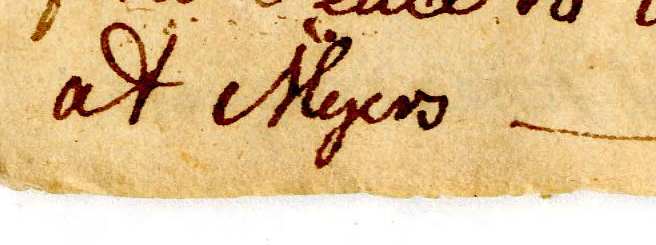at Myers-
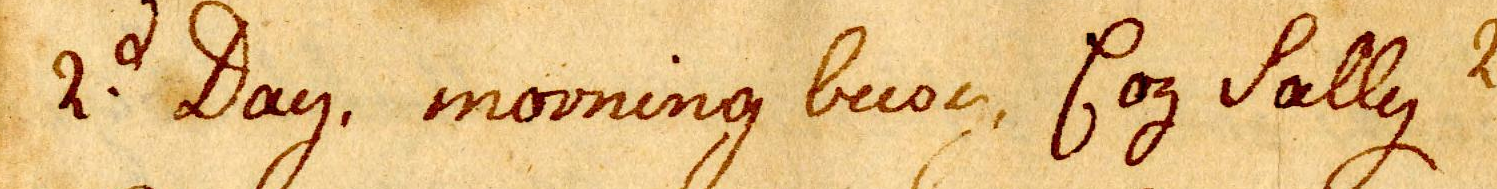2^d. Day, morning busy, Coz Sally
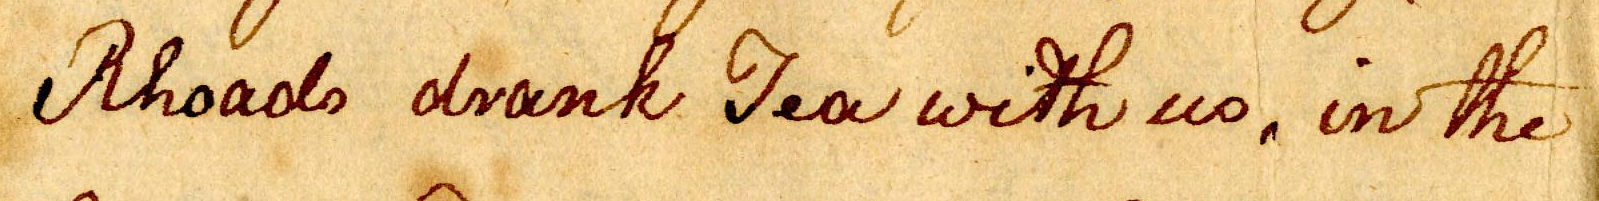Rhoads drank Tea with us, in the
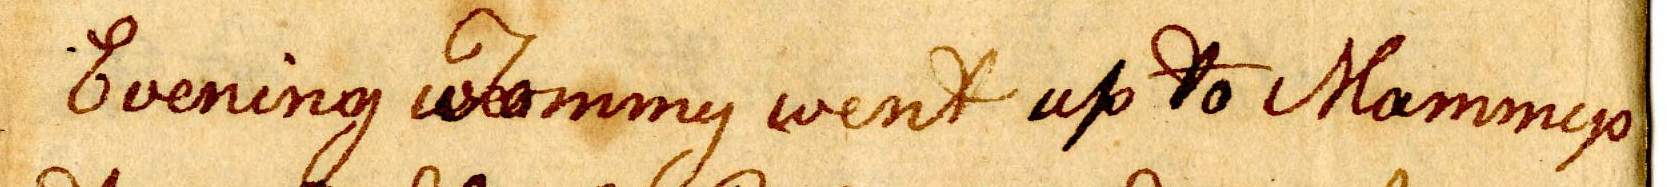Evening Tommy went up to Mammys
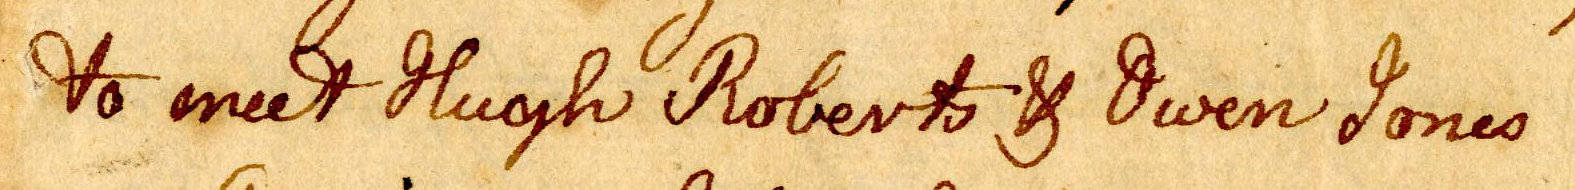to meet Hugh Roberts & Owen Jones
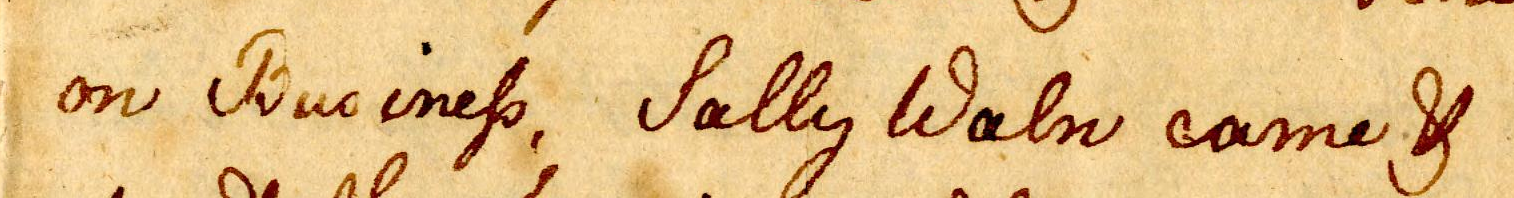on Business, Sally Waln came &
